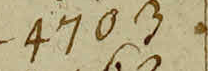4703
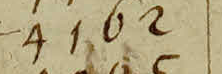4162
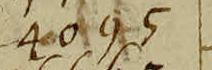4095
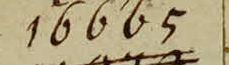16665
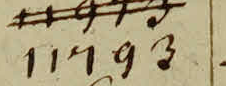11793
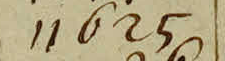11625
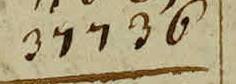37736
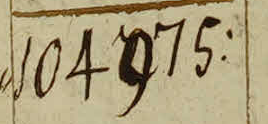104975:
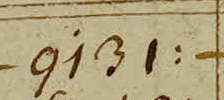9131:
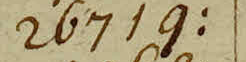26719:
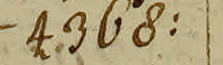4368:
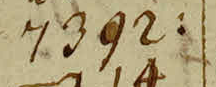7392:
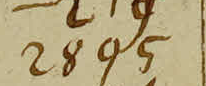2895
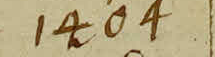1404
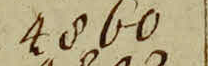4860
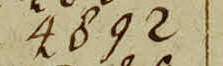4892
